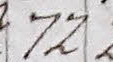72
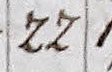22
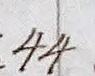44
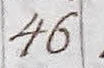46
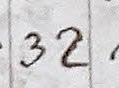32
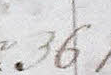36
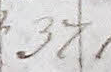37
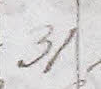31
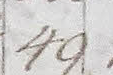49
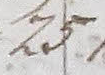25
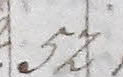52
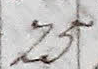25
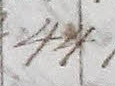44
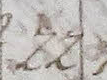22
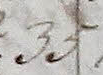35
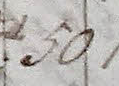50
